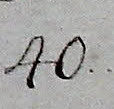40
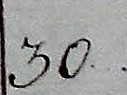30
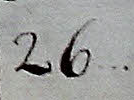26
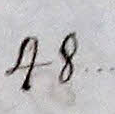48
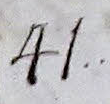41
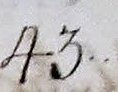43
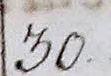30
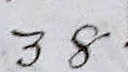38
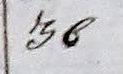36
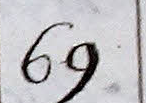69
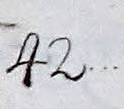42
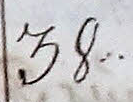38
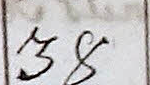38
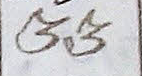33
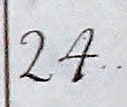24
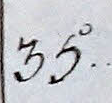35
